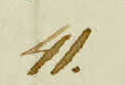41.
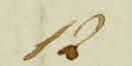12
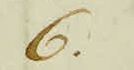6.
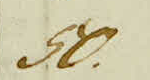50.
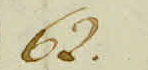62.
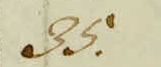35.
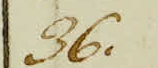36.
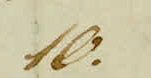10.
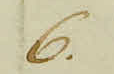6.
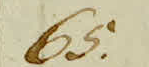65.
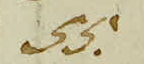55.
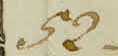52
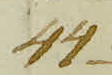44
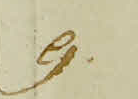9.
